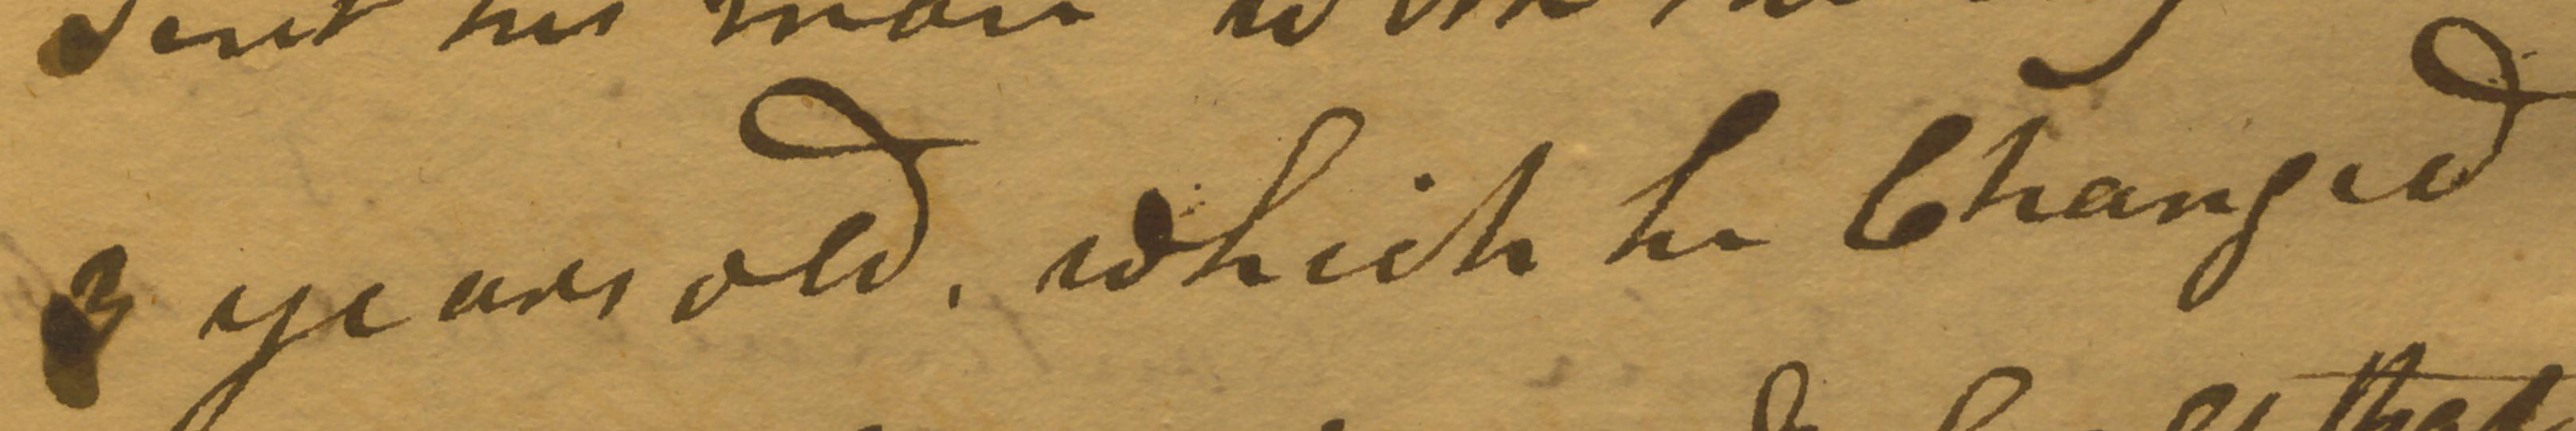3 years old. which he Changed
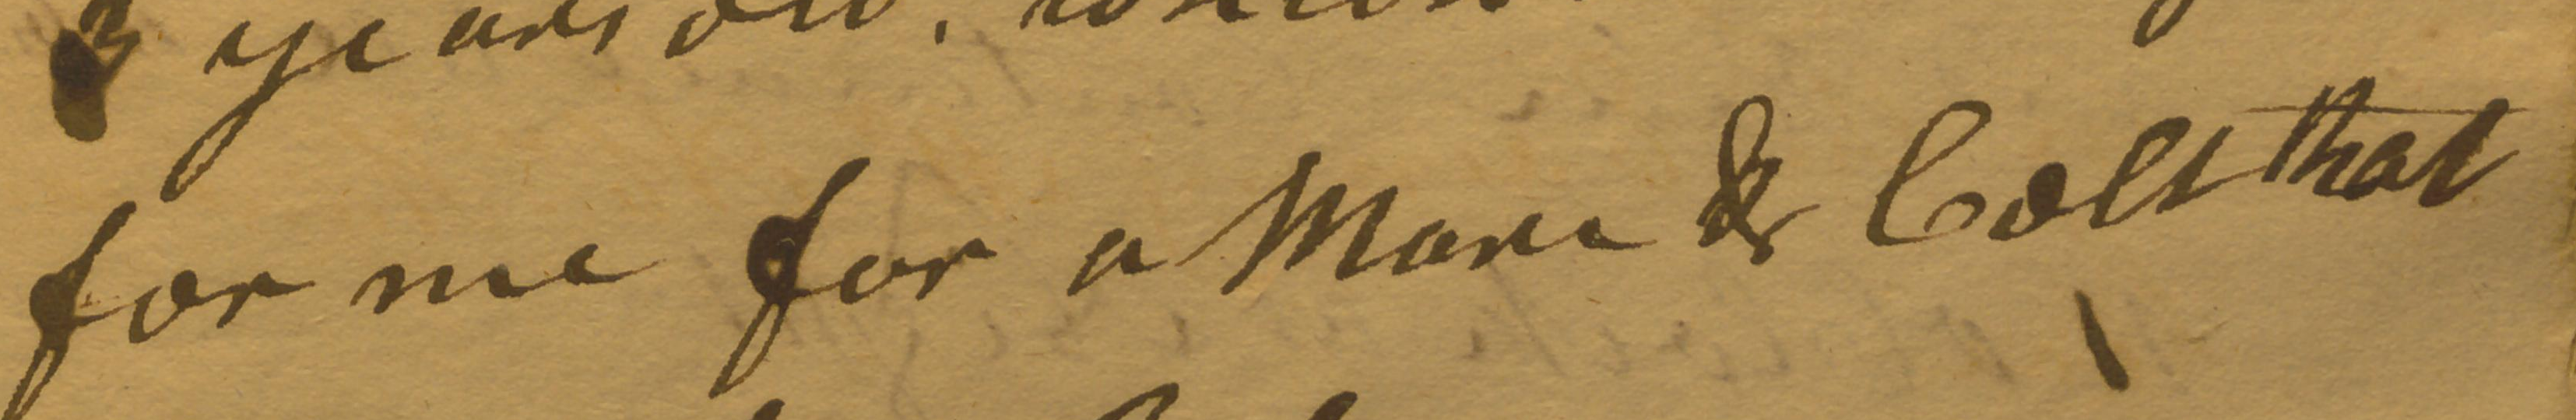or me for a Mare & Colt that
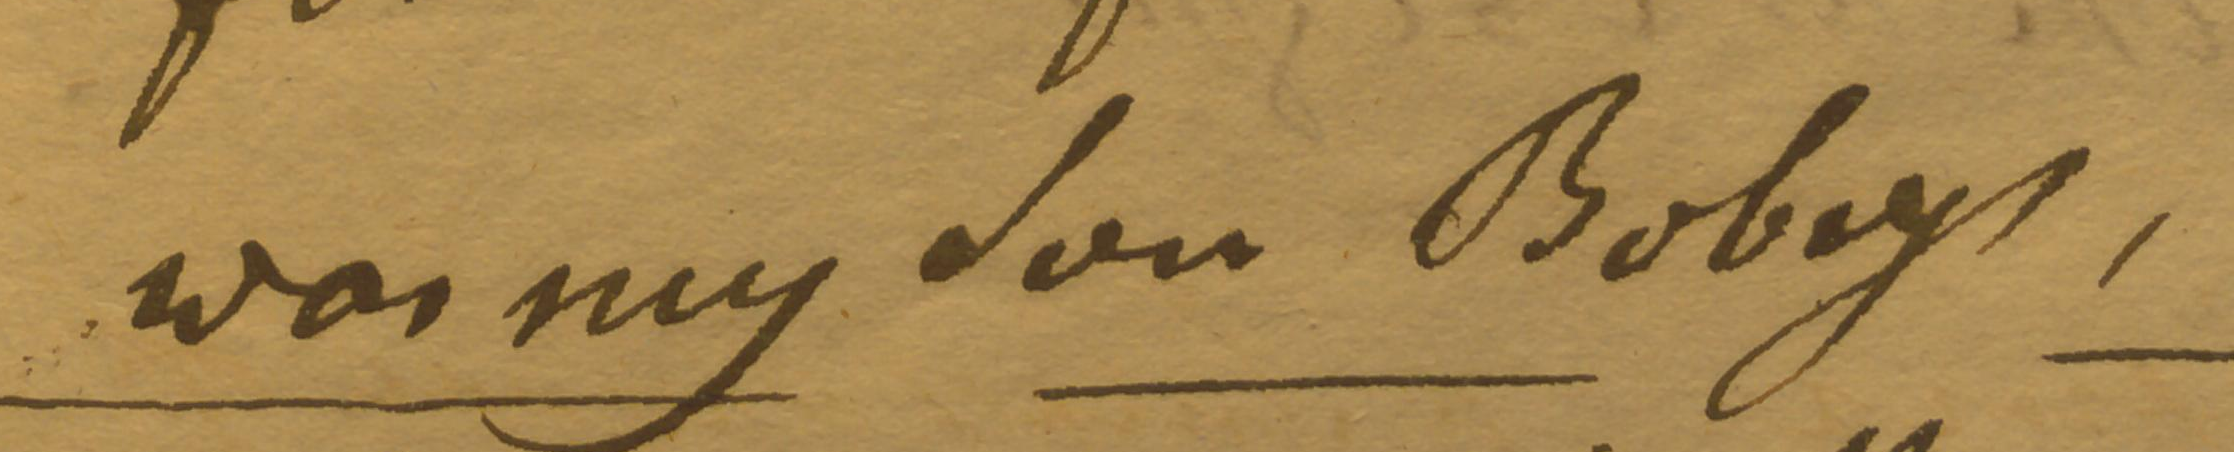was my son Bobeys,
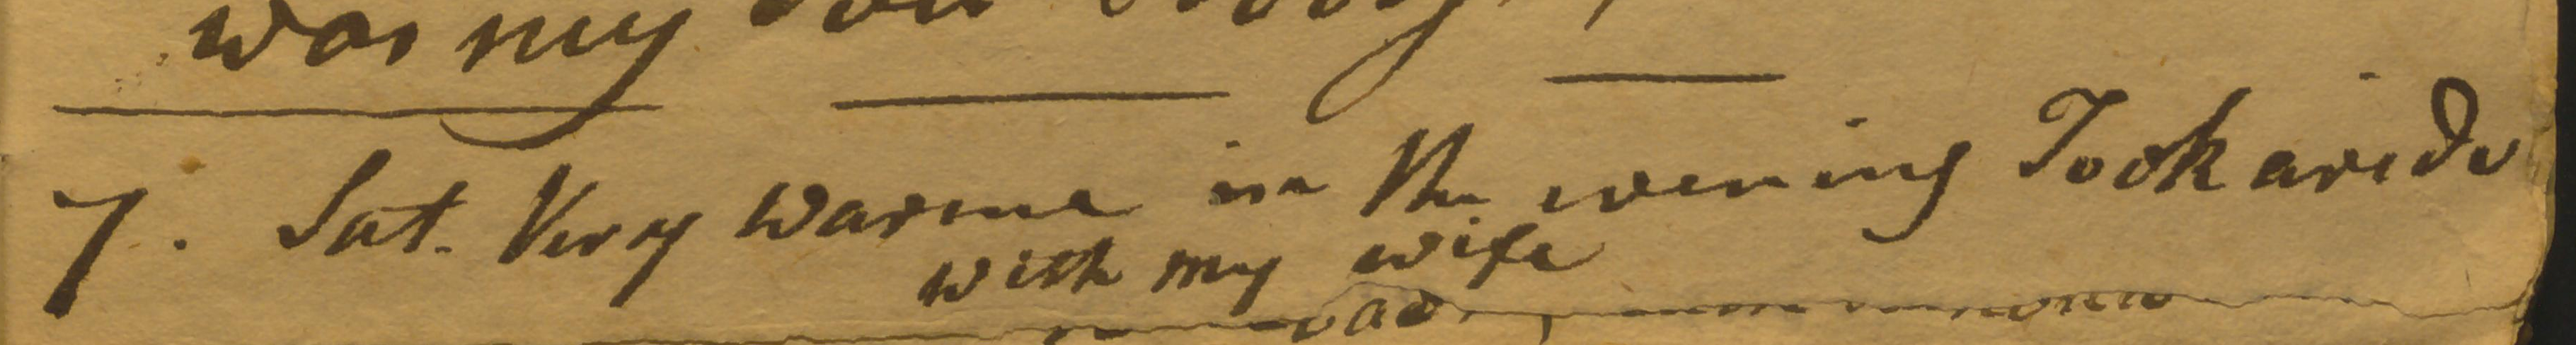7. Sat. Very warme in the evening Took a ride
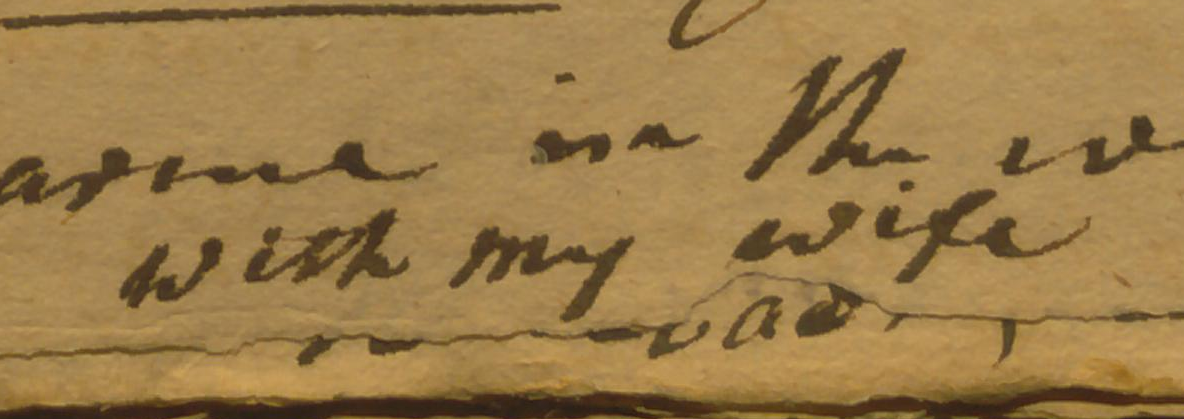with my wife
